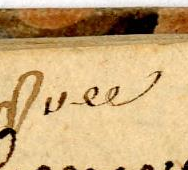see
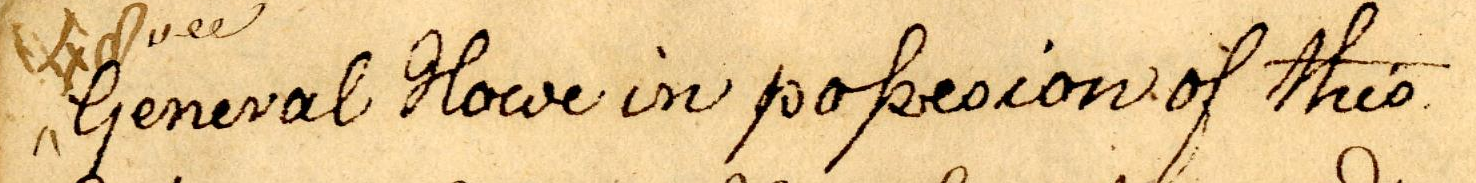^ General Howe in possesion of this
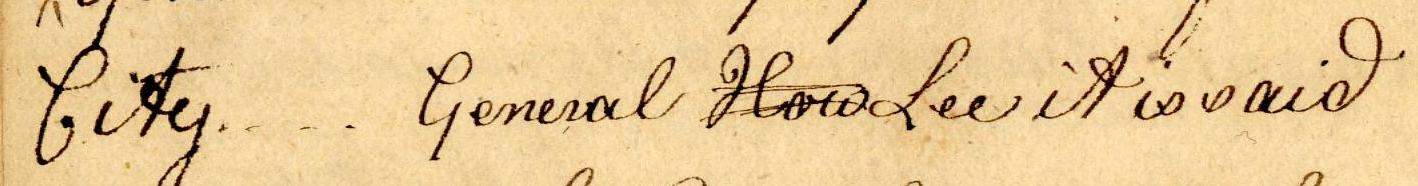City.... General [How] Lee it is said
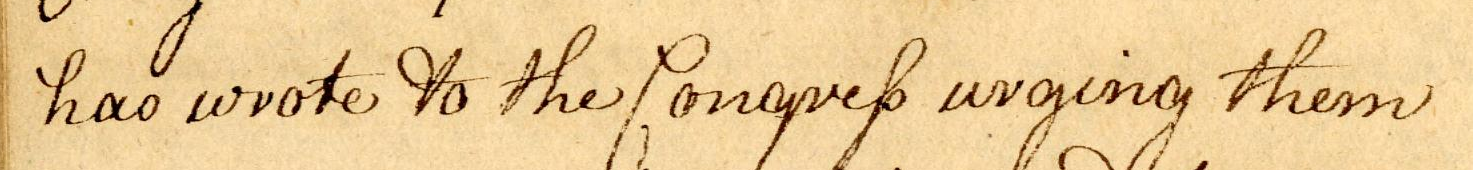has wrote to the Congress urging them
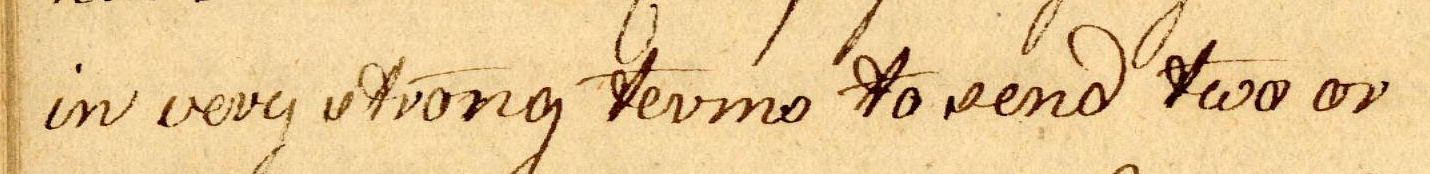in very strong terms to send two or
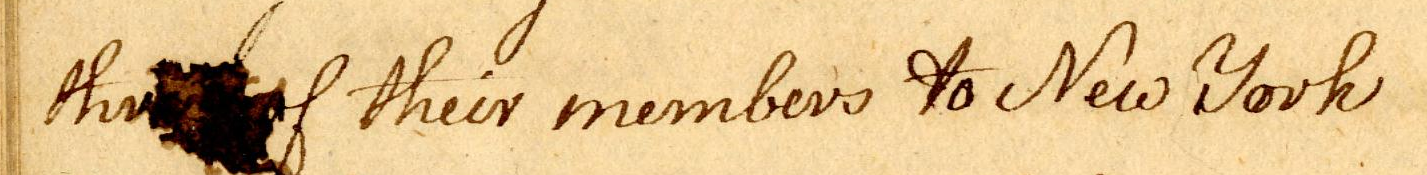thr[ee] of their members to New York
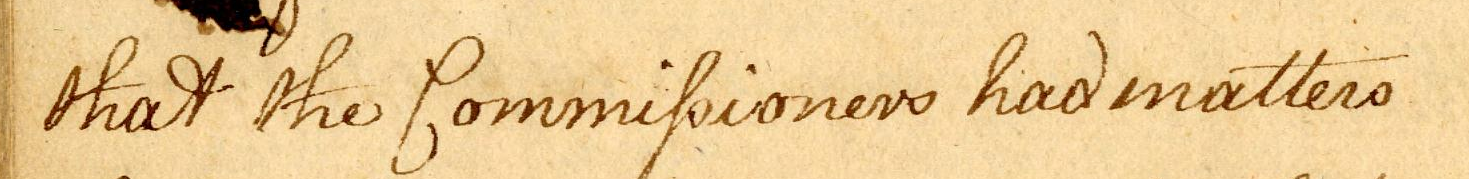that the Commissioners had matters
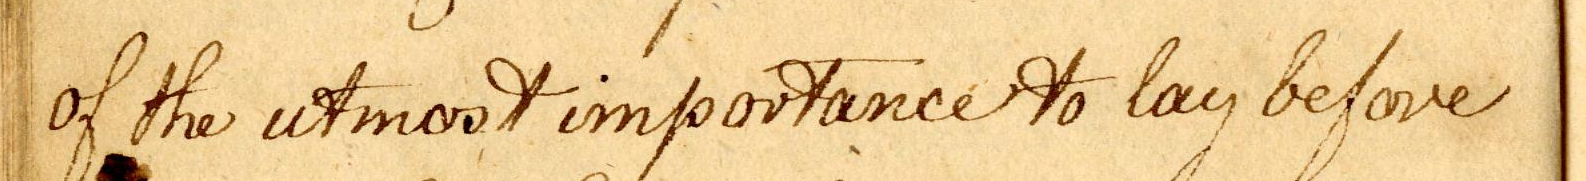of the utmost importance to lay before
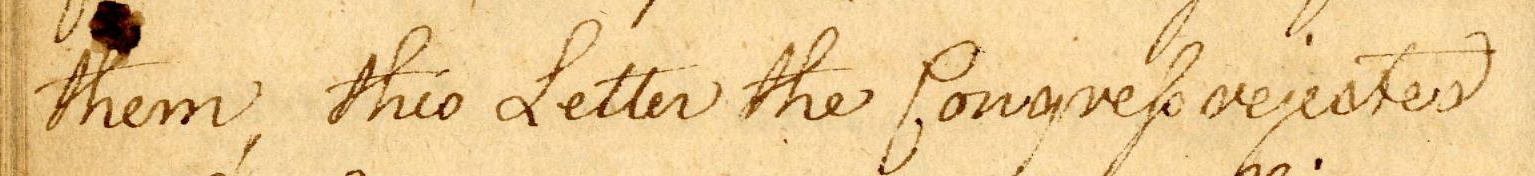them, this Letter the Congress rejected
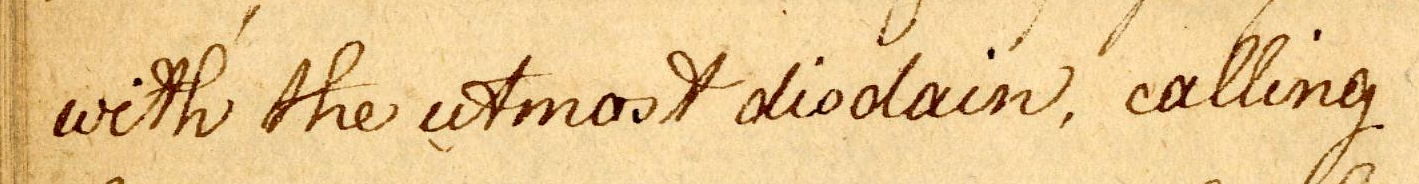with the utmost disdain, calling
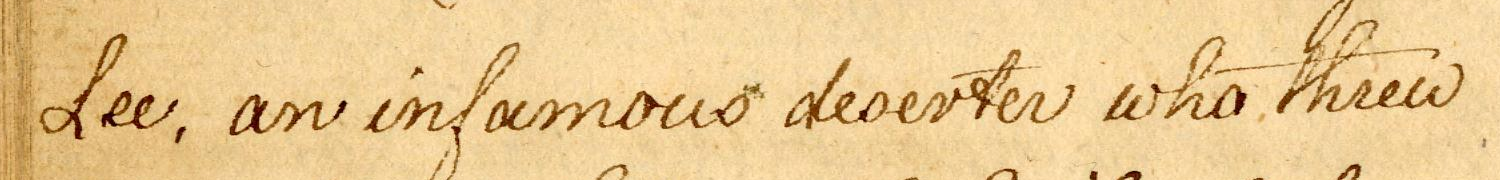Lee, an infamous deserter who threw
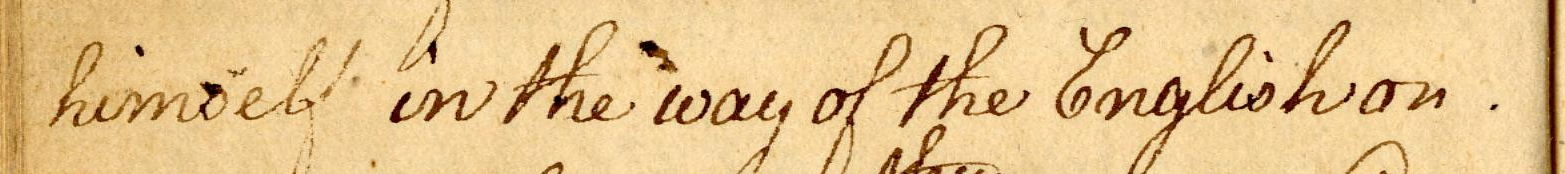himself in the way of the English on
